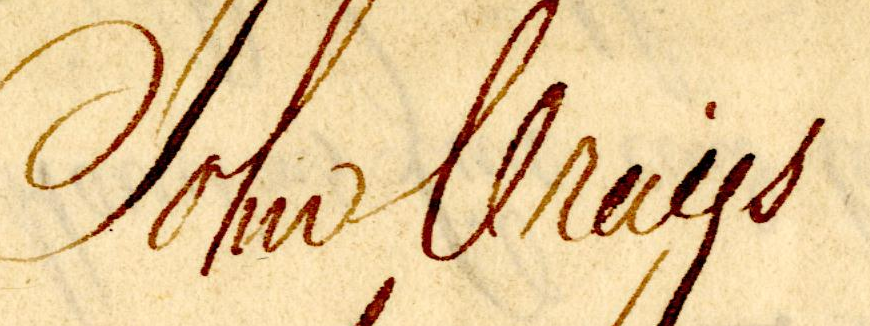John Crays
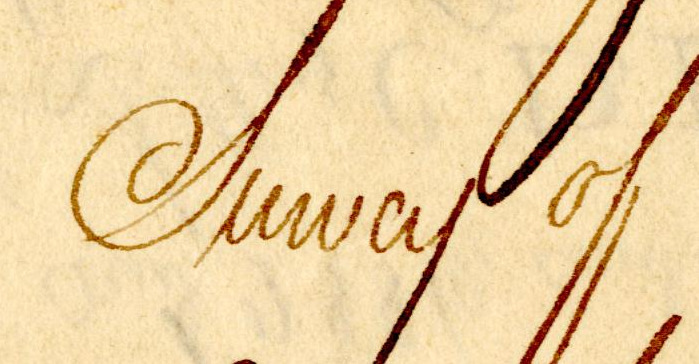Survey of
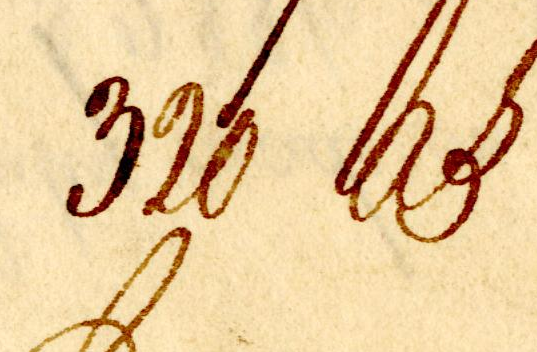320 Ac
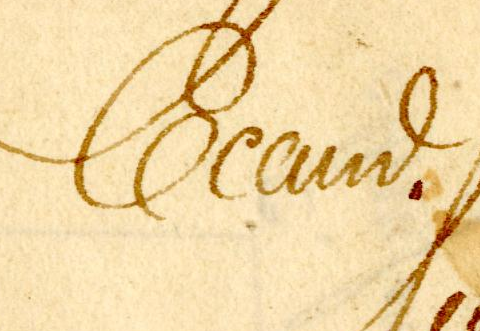Account
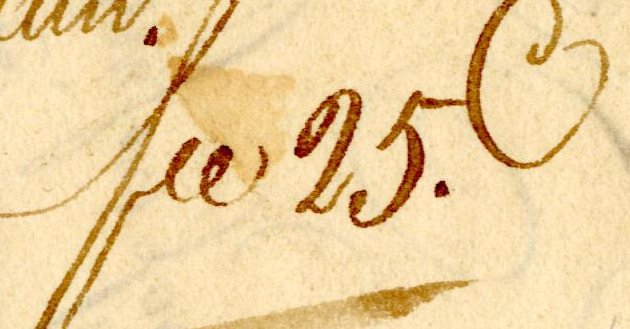fee 25^c
